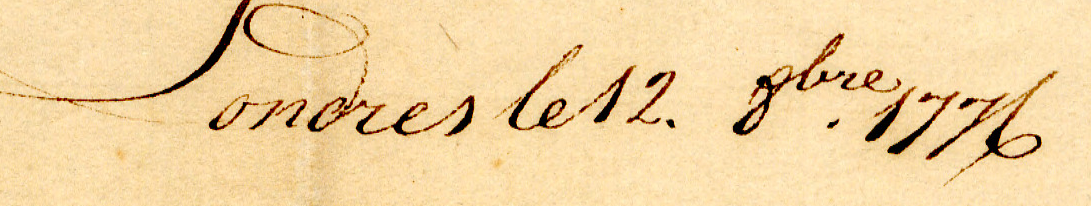Londres le 12. 8^bre. 1776
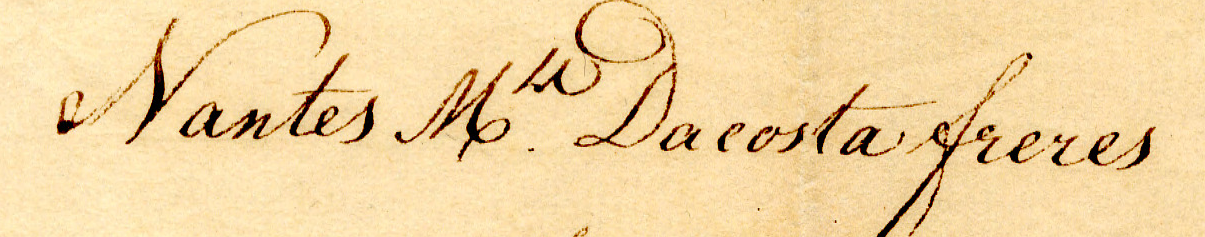Nantes M^sr. Dacosta freres
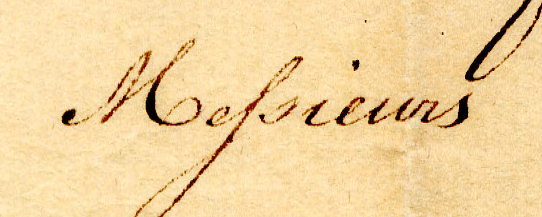Messieurs
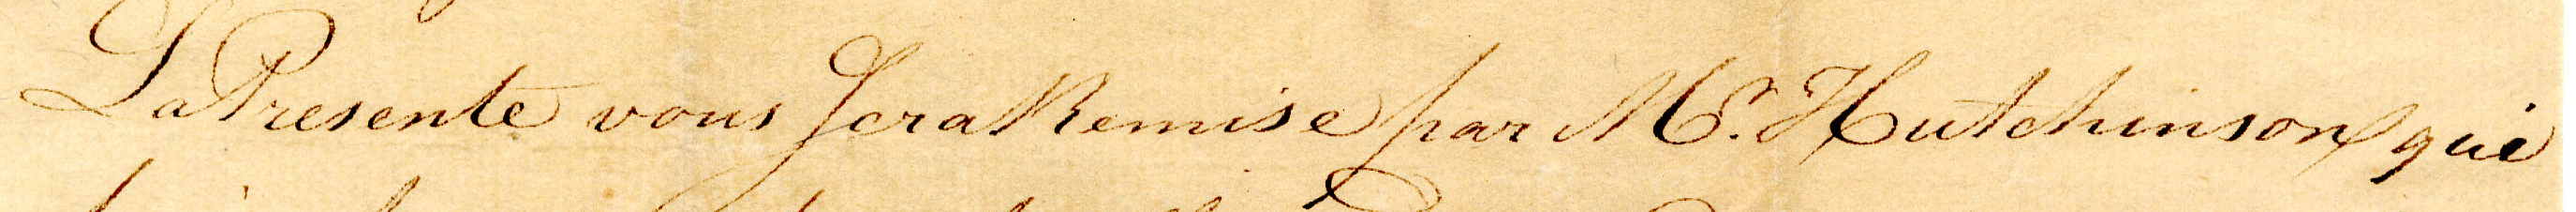La Presente vous Sera Remise par M^r. Hutchinson qui
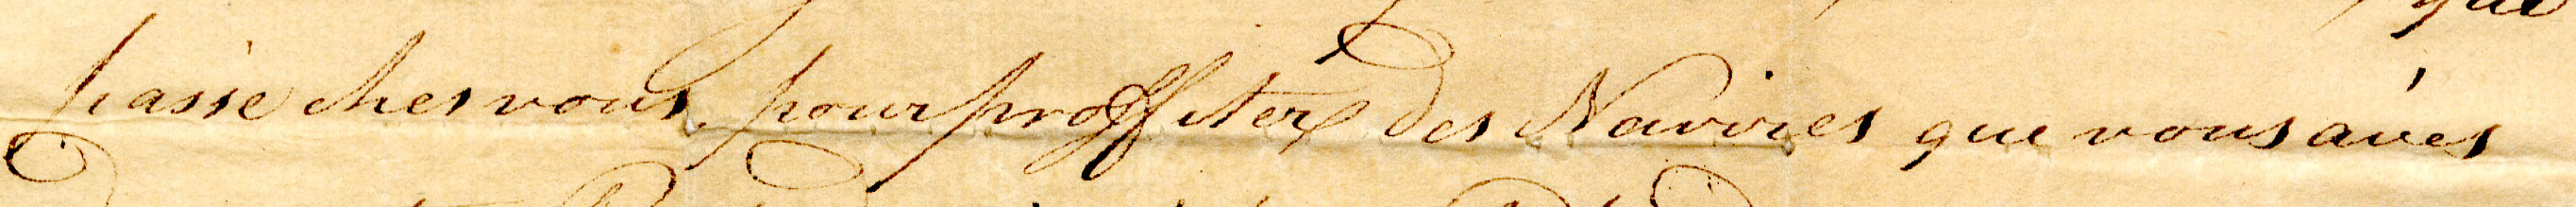liasse chez vous, pour proffiter des Navires que vous aves
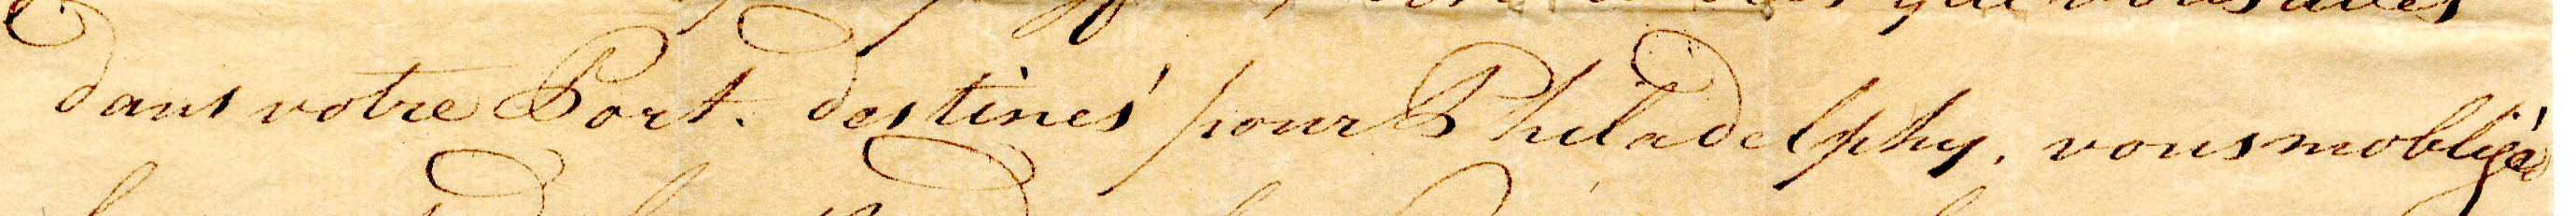dans votre Port. destinés pour Philadelphy. vous mobligé
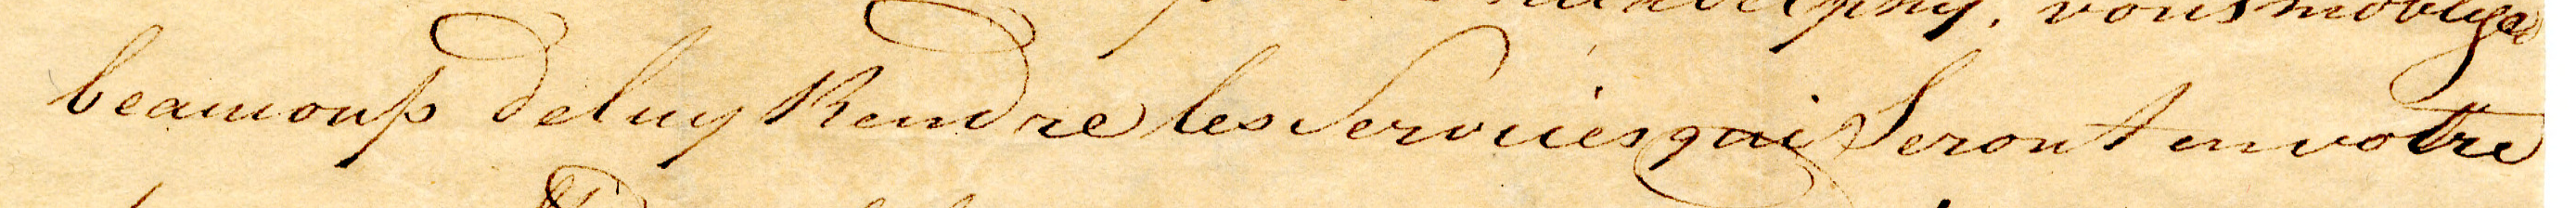beaucoup deluy Rendre les Services qui Seront en votre
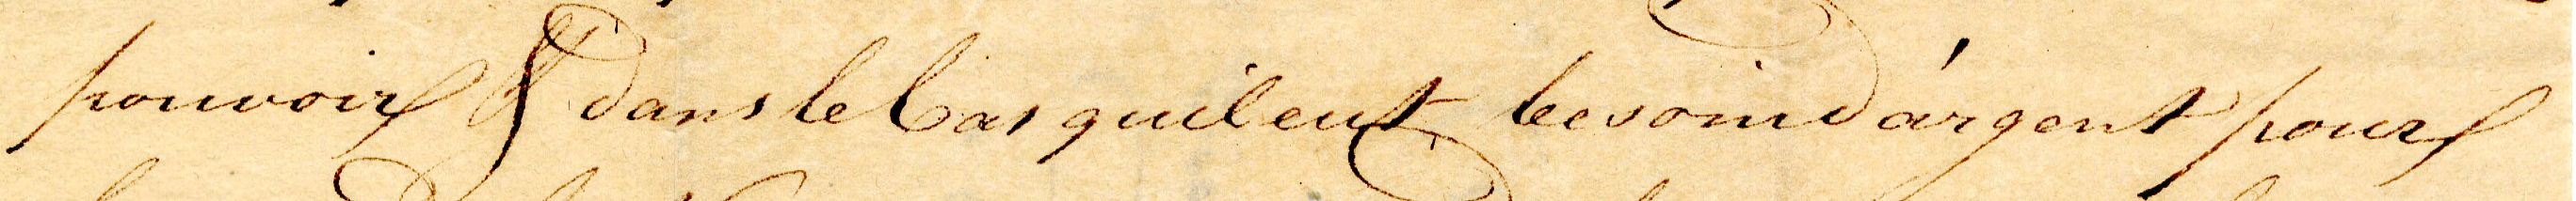pouvoir & dans le Cas quileut besoin d'argent pour
